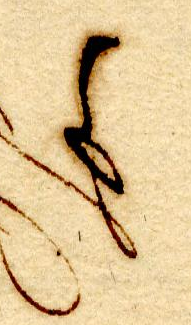To
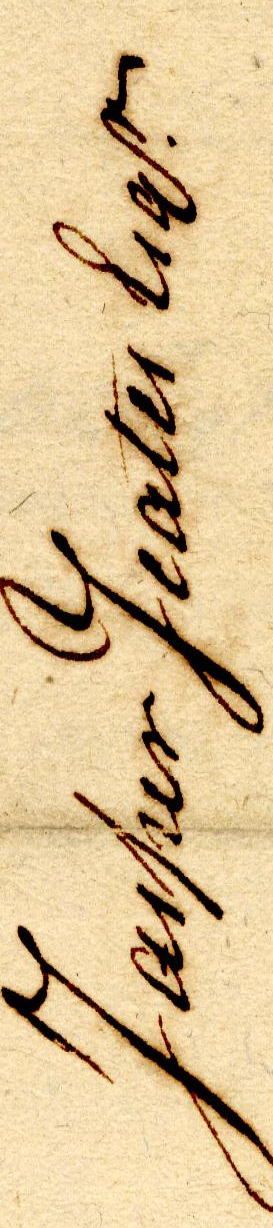Jasper Yeates Esq^r.
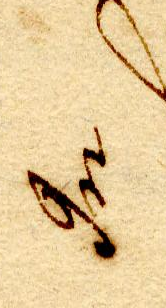In
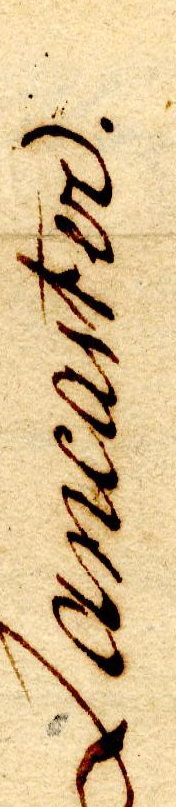Lancaster.
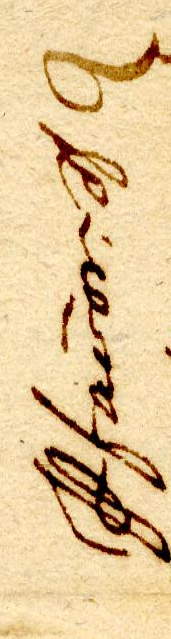per favor of
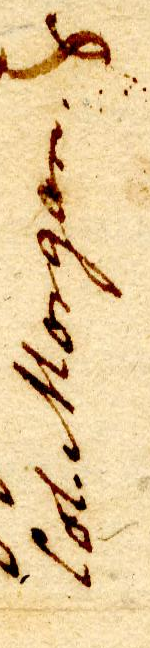Col. Morgan.
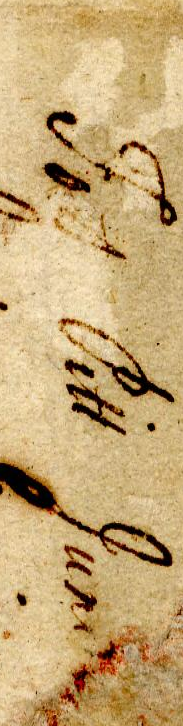Fort Pitt June
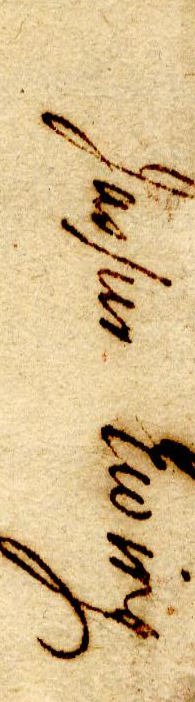Jasper Ewing
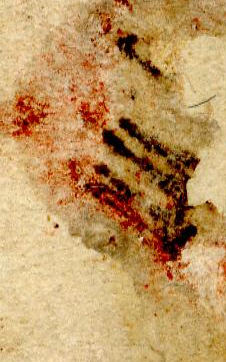1777
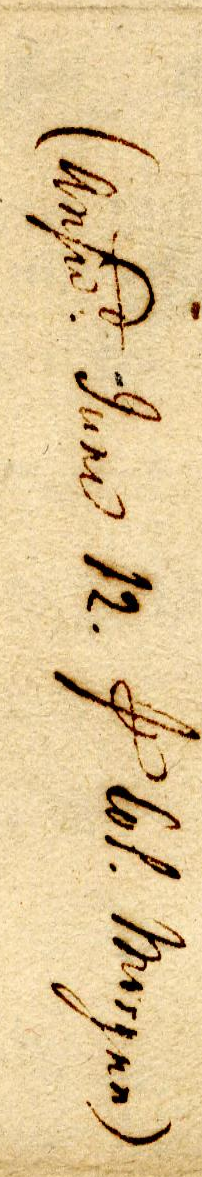(answ^d. June 12. by Col. Morgan)
